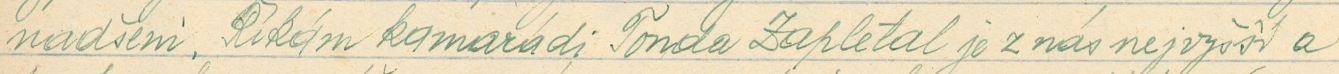nadšení. Říkám kamarádi Tonda Zapletal je z nás nejvyšší a
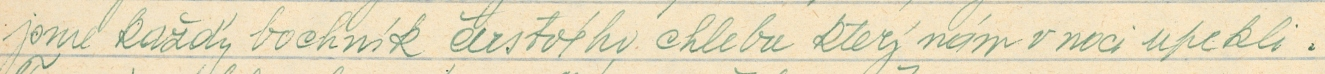jsme každý bochník čerstvého chleba který nám v noci upekli.
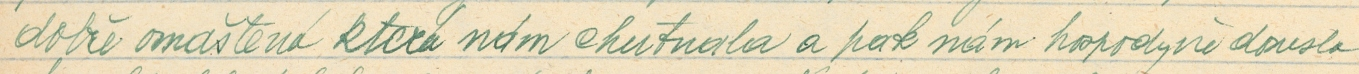dobře omaštěná která nám chutnala a pak nám hospodyně donesla
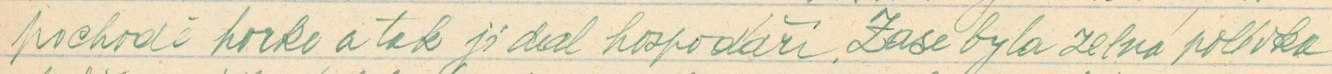pochodě horko a tak jí dal hospodáři. Zase byla zelná polévka
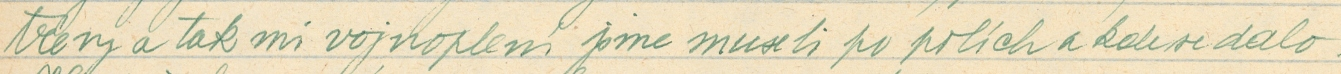trény a tak mi vojnoplení jsme museli po polích a kde se dalo.
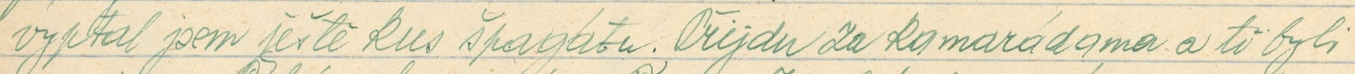vyptal jsem ještě kus špagátu. Přijdu za kamarádama a to byli
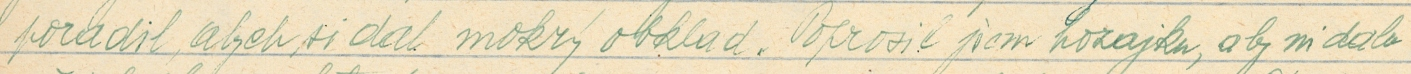poradil, abych si dal mokrý obklad. Poprosil jsem hozajku, aby mi dala
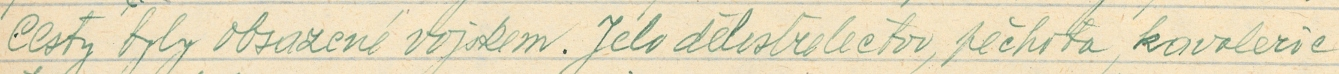Cesty byly obsazené vojskem. Jeho dělostřelectvo, pěchota, kavalerie
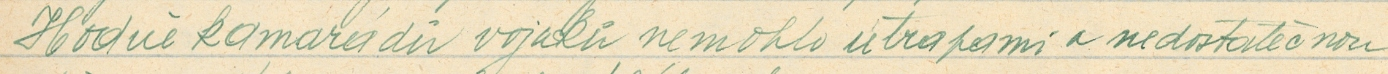Hodně kamarádů vojaků nemohlo útrapami a nedostatečnou
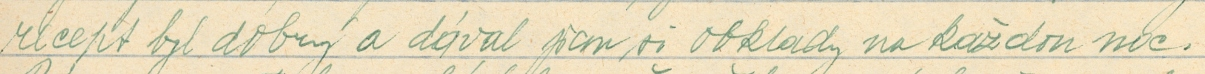recept byl dobrý a dával jsem si obklady na každou noc.
